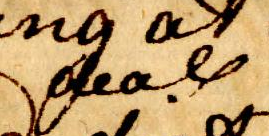deal
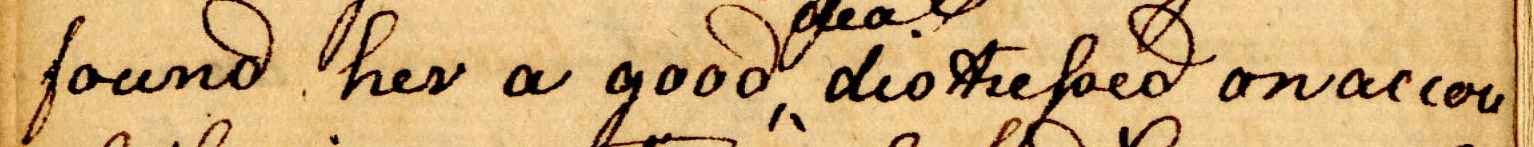found her a good ^ distressed on accou
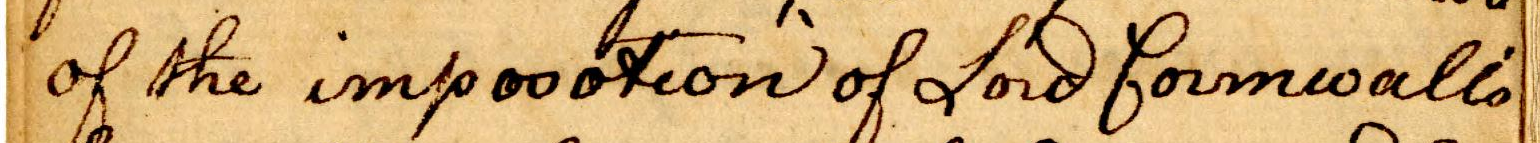of the imposotion of Lord Cornwalls
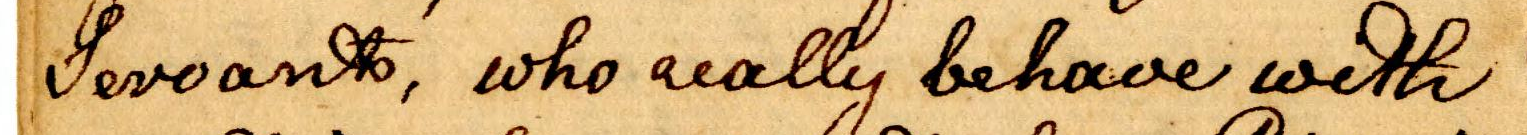Servants, who really behave with
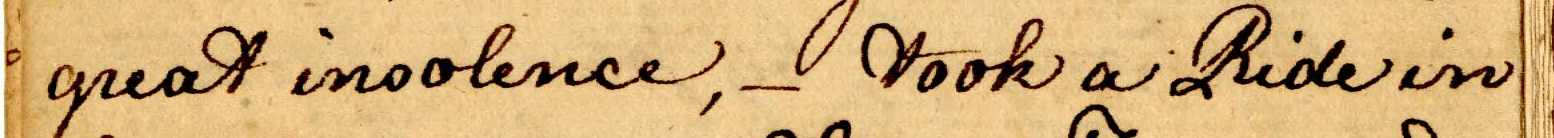great insolence,- took a Ride in
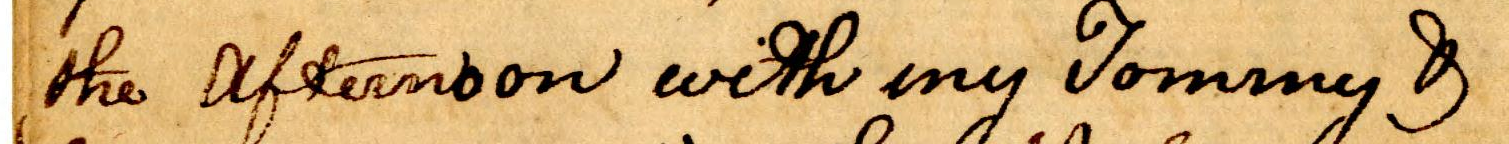the Afternoon with my Tommy &
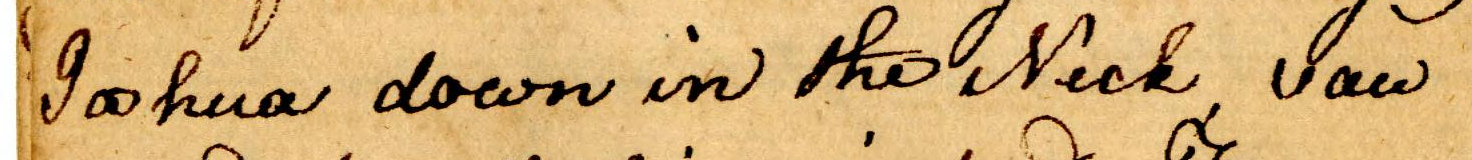Joshua down in the Neck saw
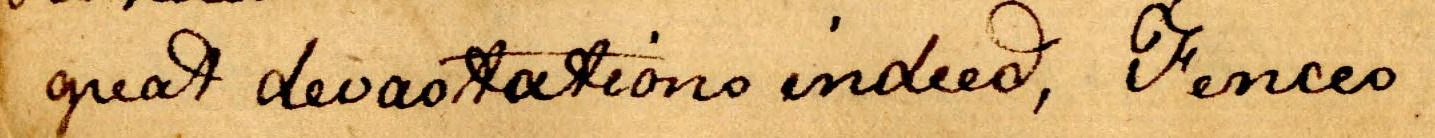great devastations indeed, Fences
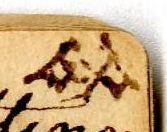41
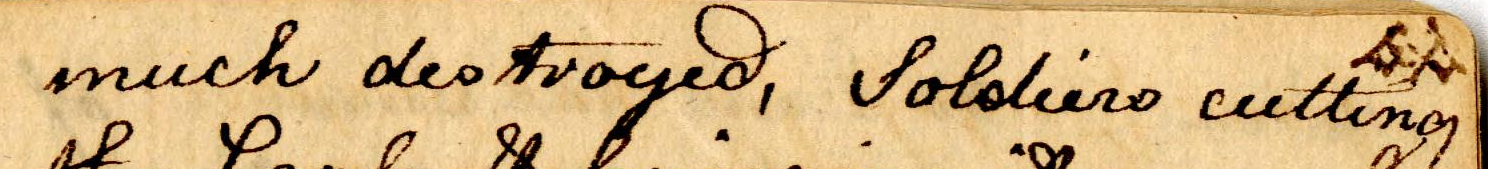much destroyed, Soldiers cutting
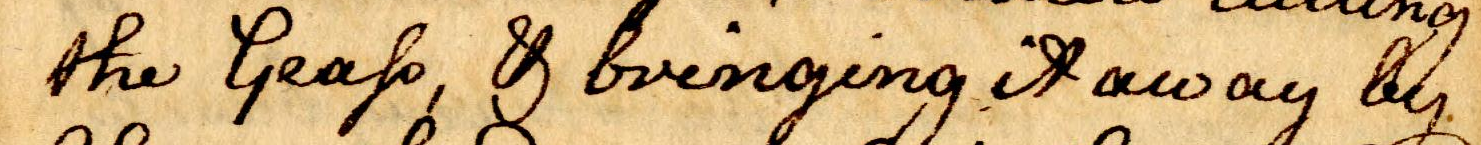the Grass, & bringing it away by
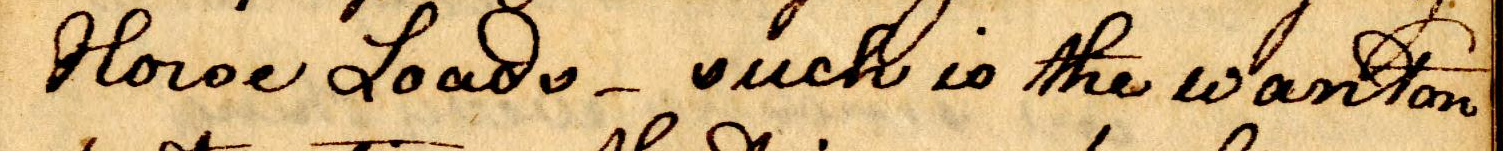Horse Loads- such is the wanton
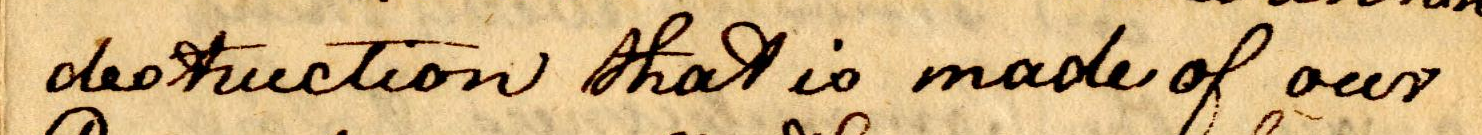destruction that is made of our
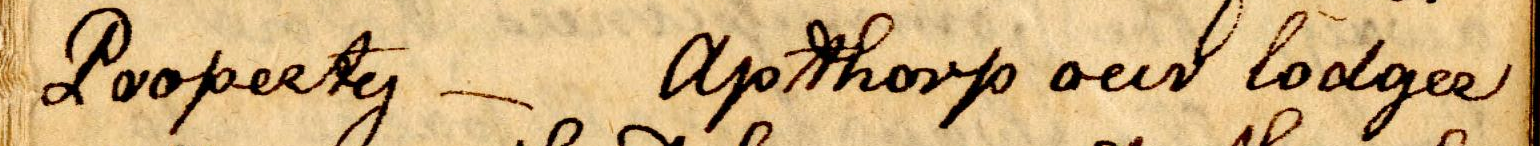Property- Apthorp our lodger
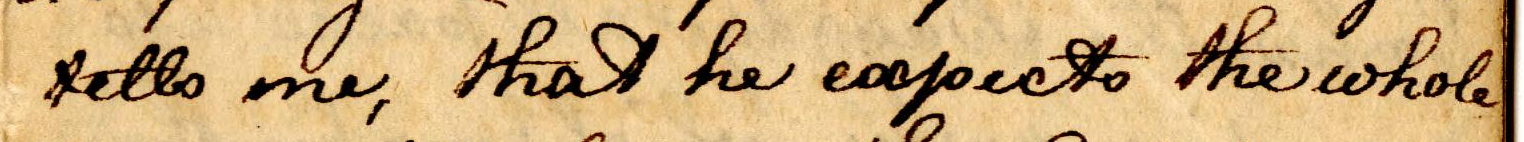tells me, that he expects the whole
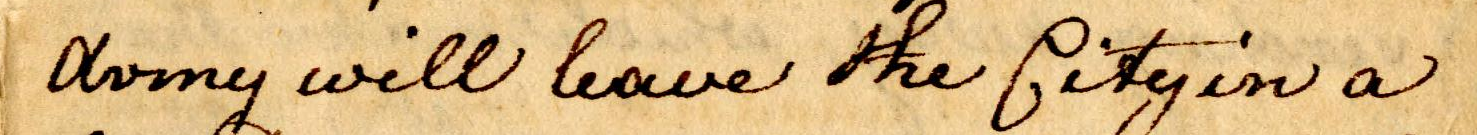Army will leave the City in a
